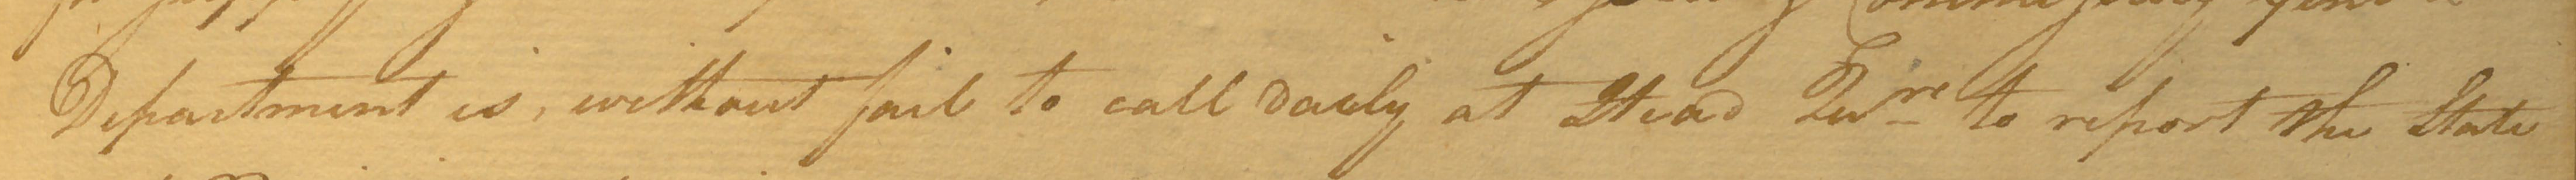Department is, without fail to call daily at Head Qu^rs to report the State
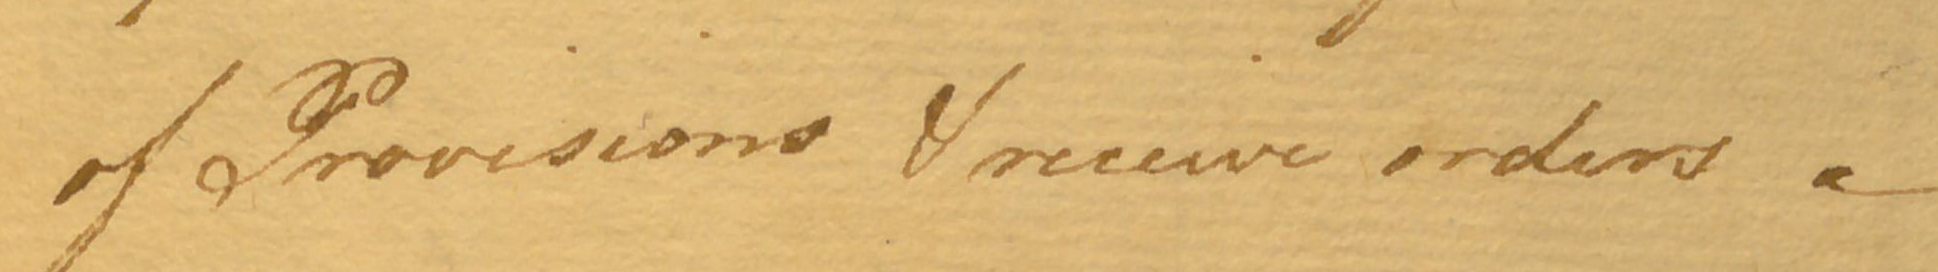of Provisions & receive orders.
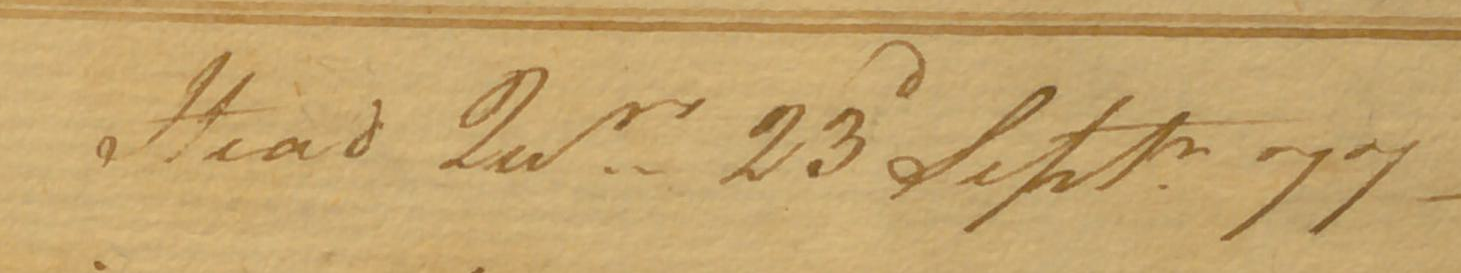Head Qu^rs. 23^d Sept^r. 77-
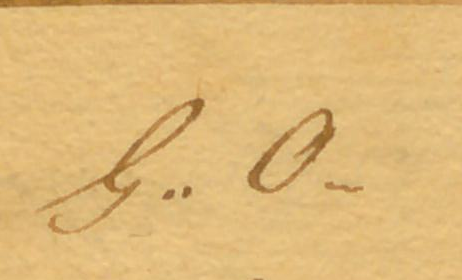G.O.
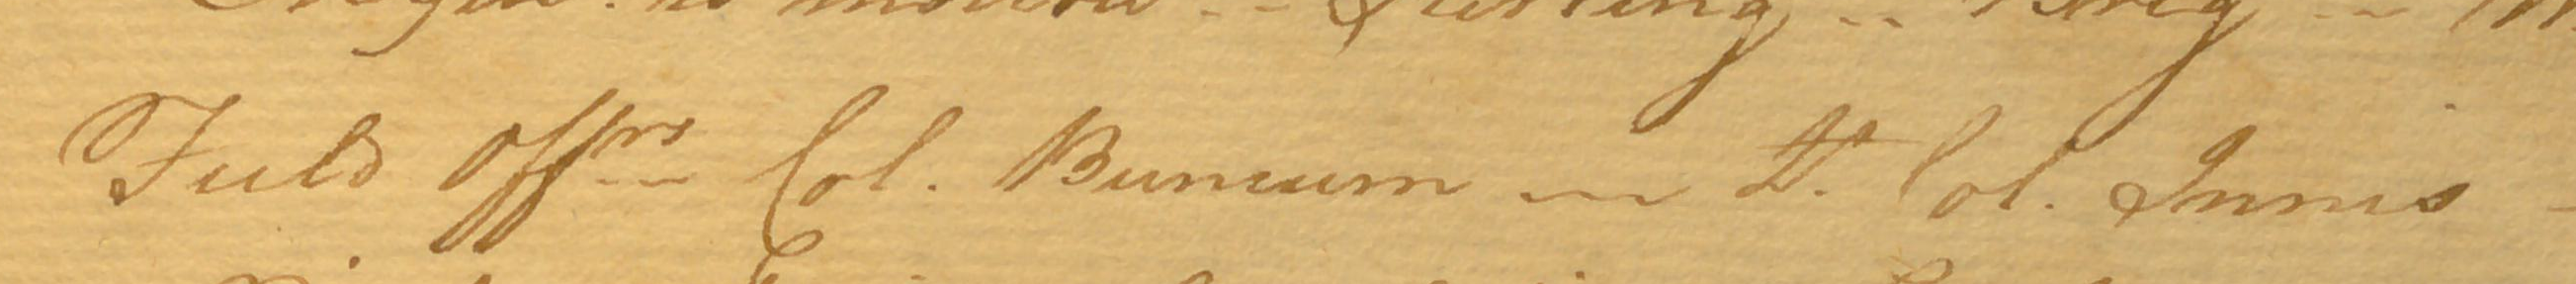Field Off^rs Col. Buncum- L^t. Col. Innis
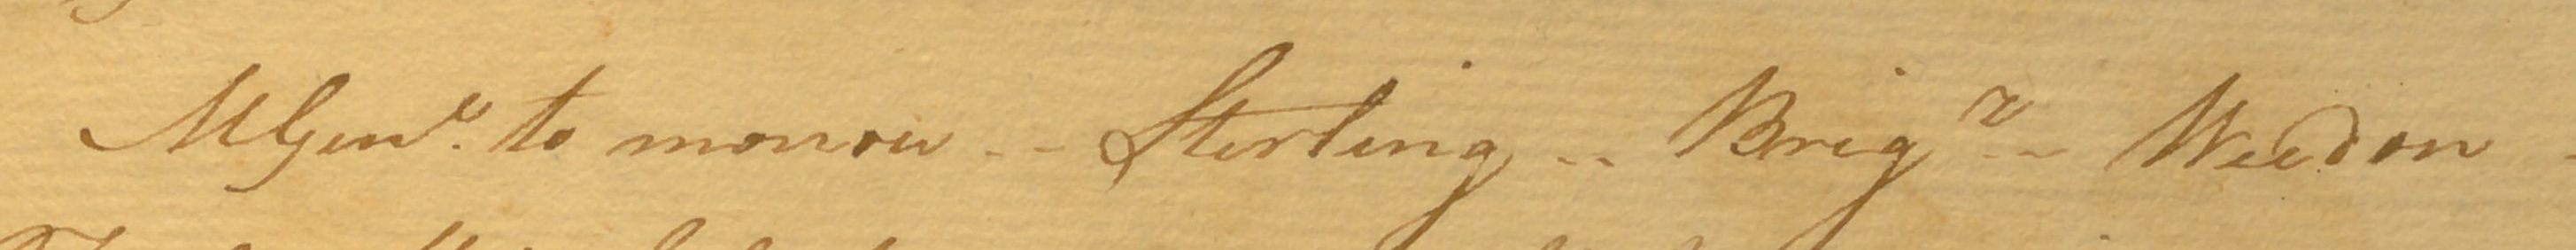M Gen^l. to morrow.. Sterling.. Brig^r- Weedon
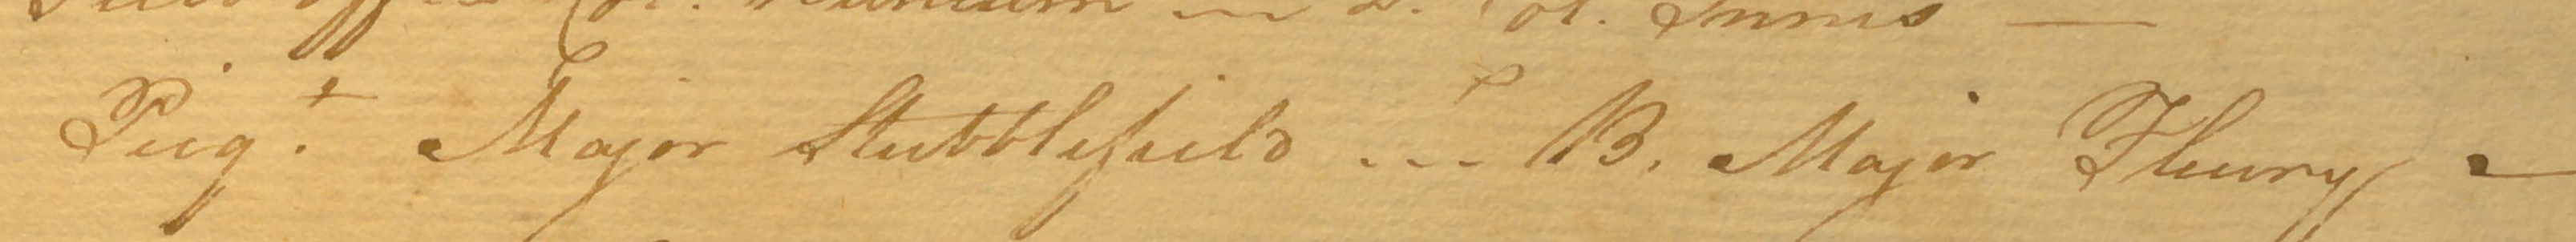Picq^t. Major Stubblefield... B. Major Fleury.
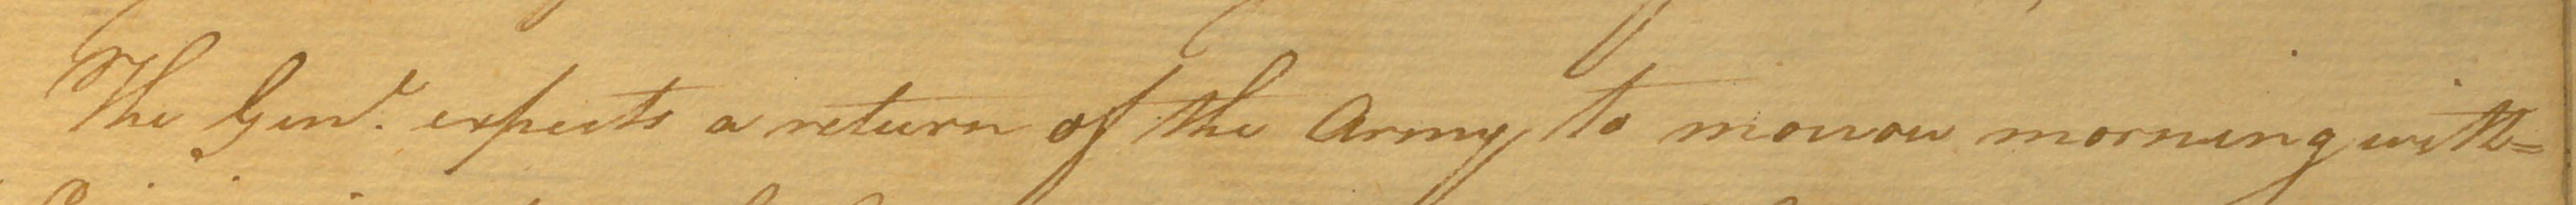The Gen^l. expects a return of the Army to morrow morning with-
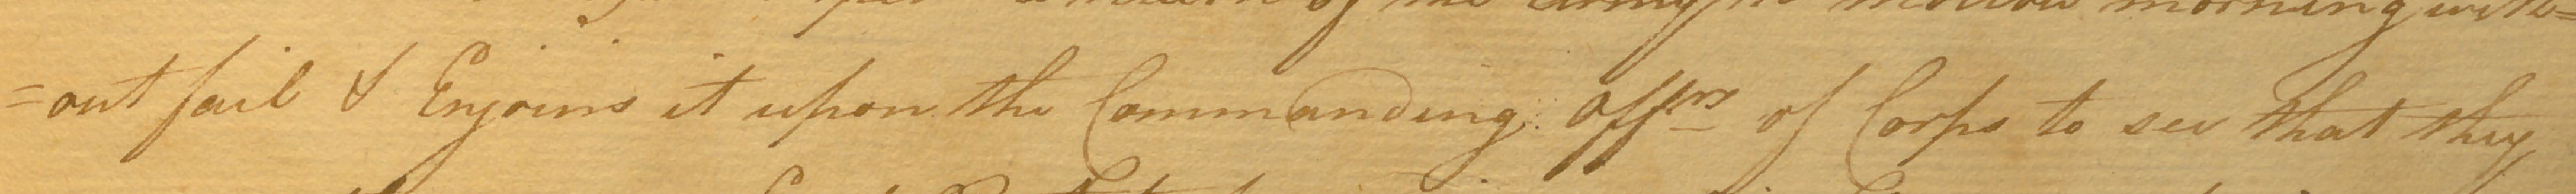-out fail & Enjoins it upon the Commanding Off^rs of Corps to see that they
